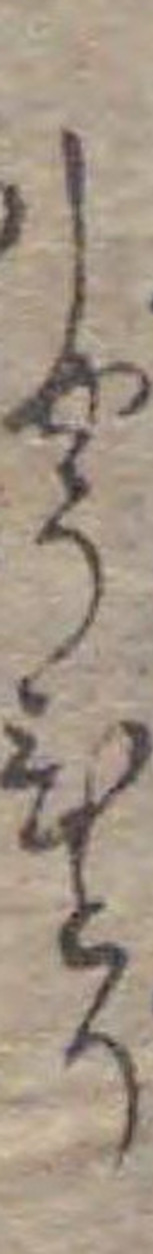しやうひとり
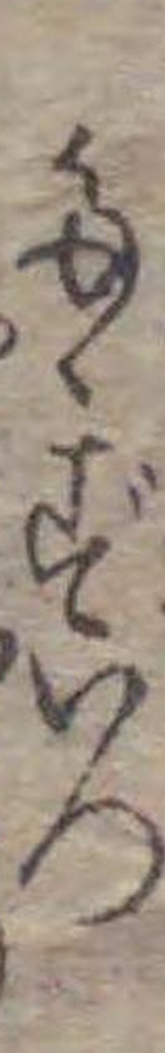たゝずいつ
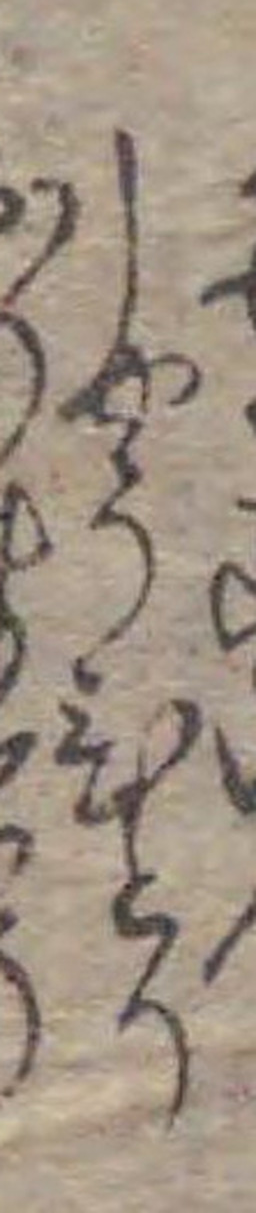しやうひとり
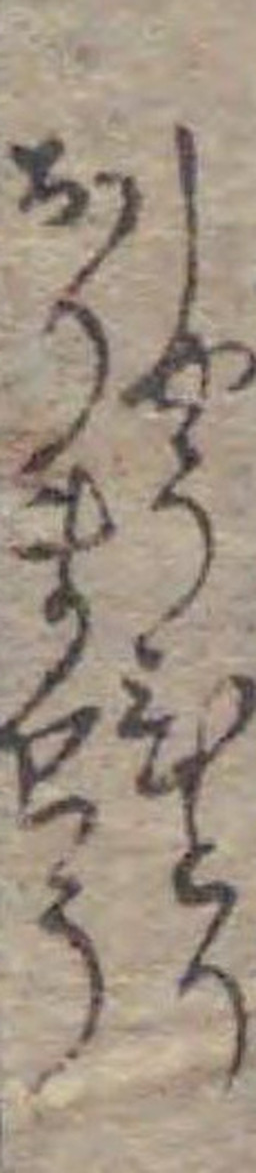おりませう

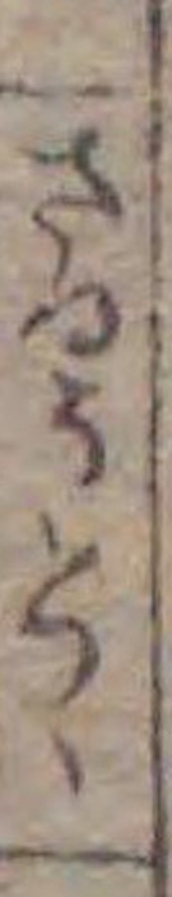さるうとく
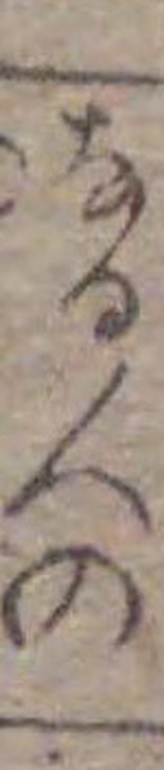なる人の
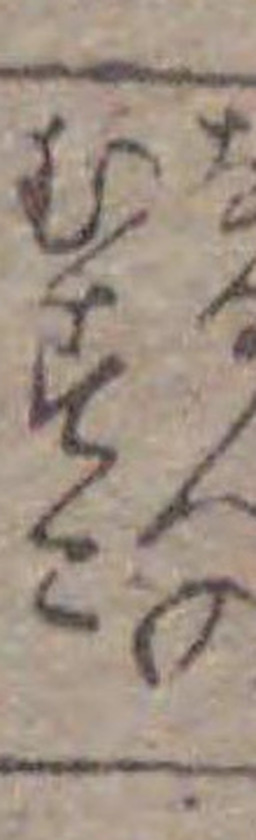むすこ
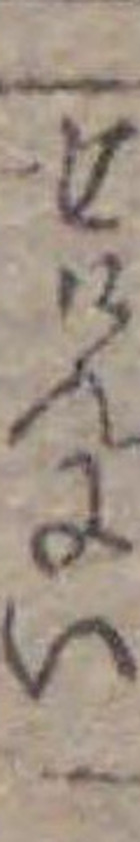女にんにい
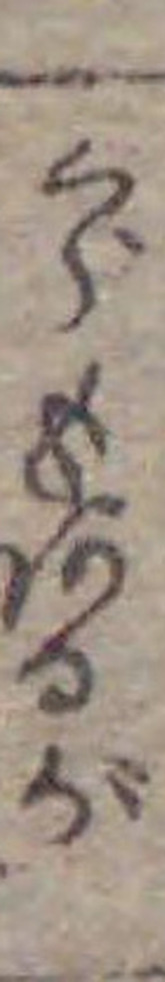くらもあるが
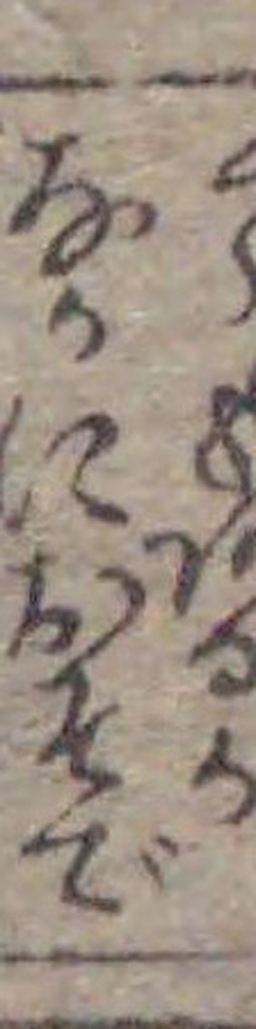なかにおそで
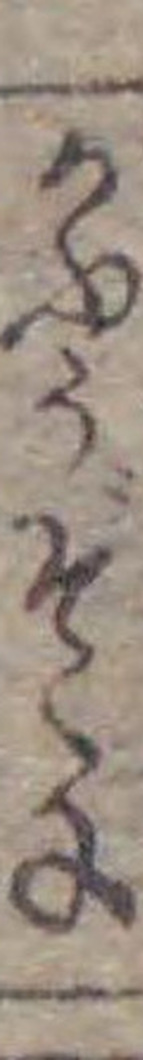がふうぞくに
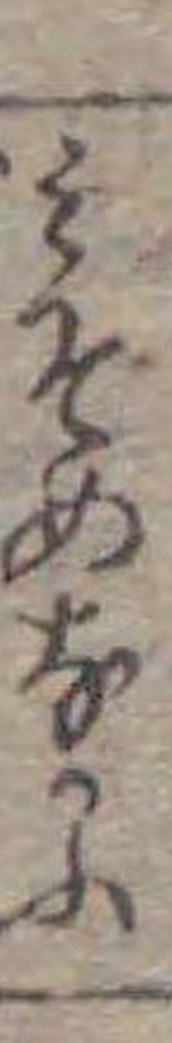みそめなかふ
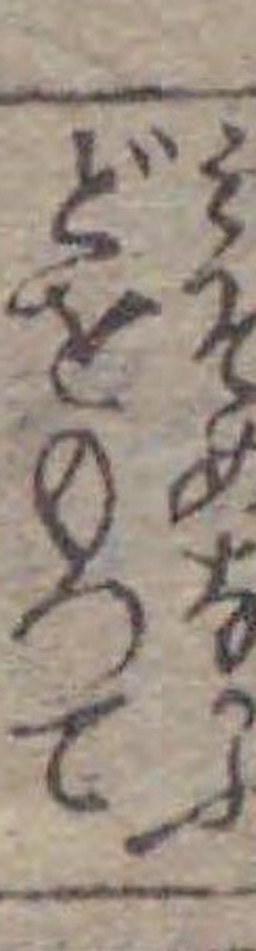どをもつて
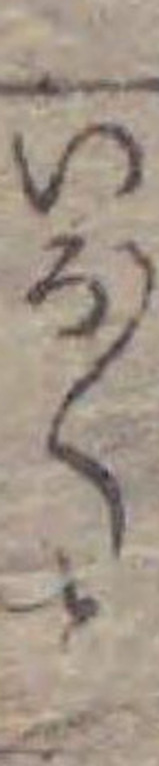いろ〳〵と
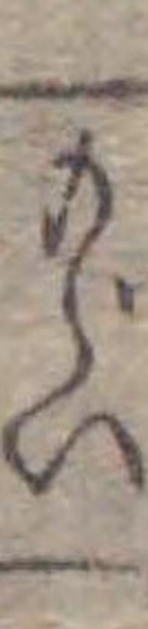もらい
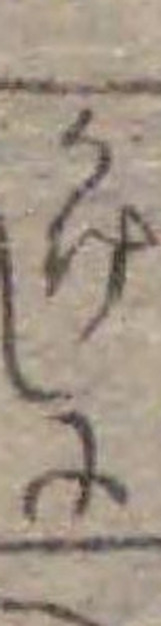かけしに
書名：神田与吉一代記 : 3巻
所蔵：国立国会図書館 National Diet Library, JAPAN
